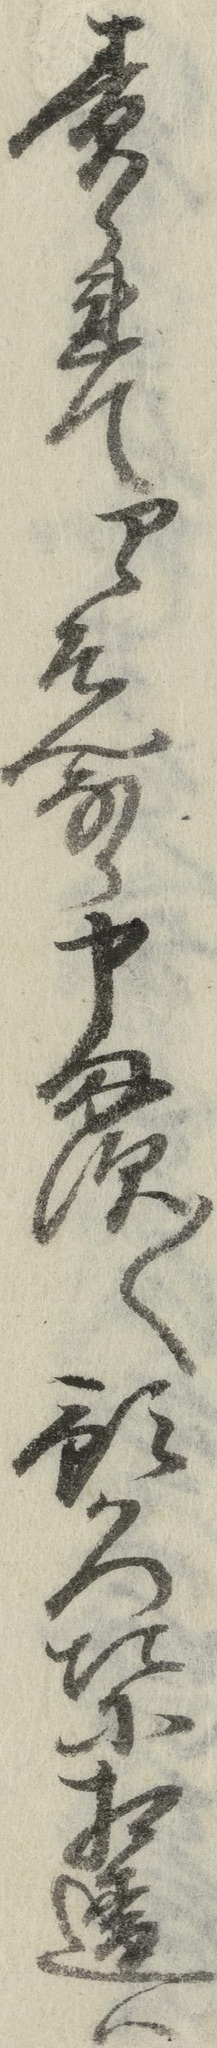責られてアゝそんなら申ます〳〵預かつたに相違は

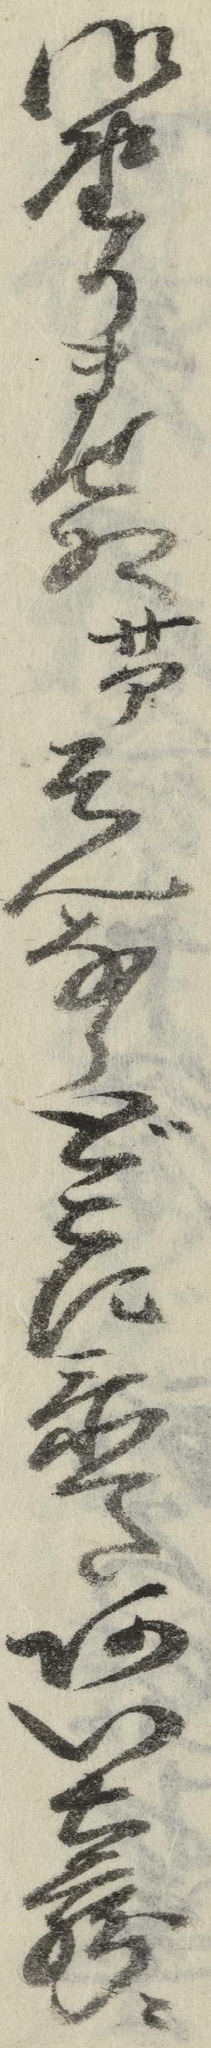御座りませぬサアそんならどこに置たあい土蔵に
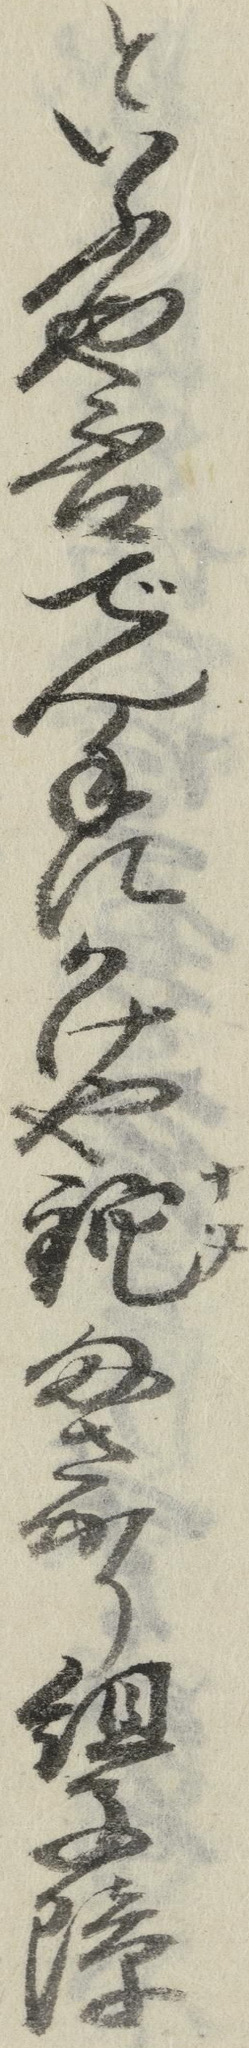といふや否でん手にかけや鉈まさかり組子障
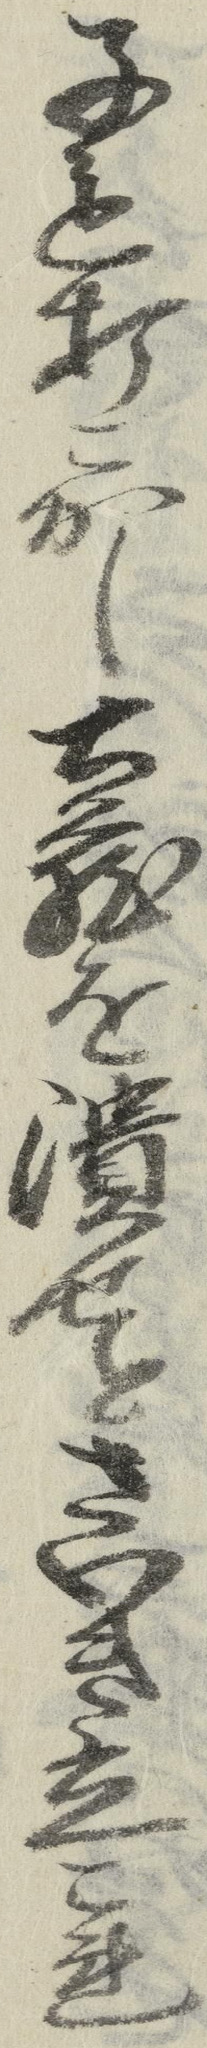子を打こかし土蔵を潰せとさワき立これ
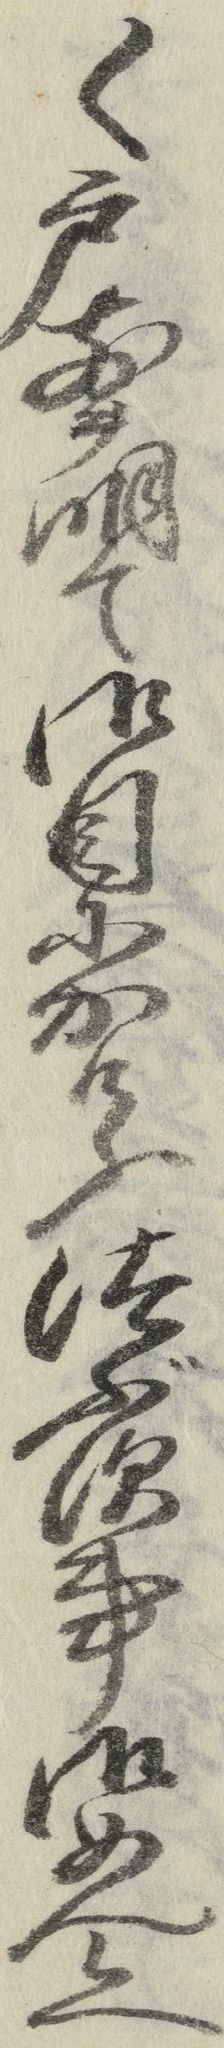〳〵戸前ヲ明て御目にかけふつぶす事御めん候へ
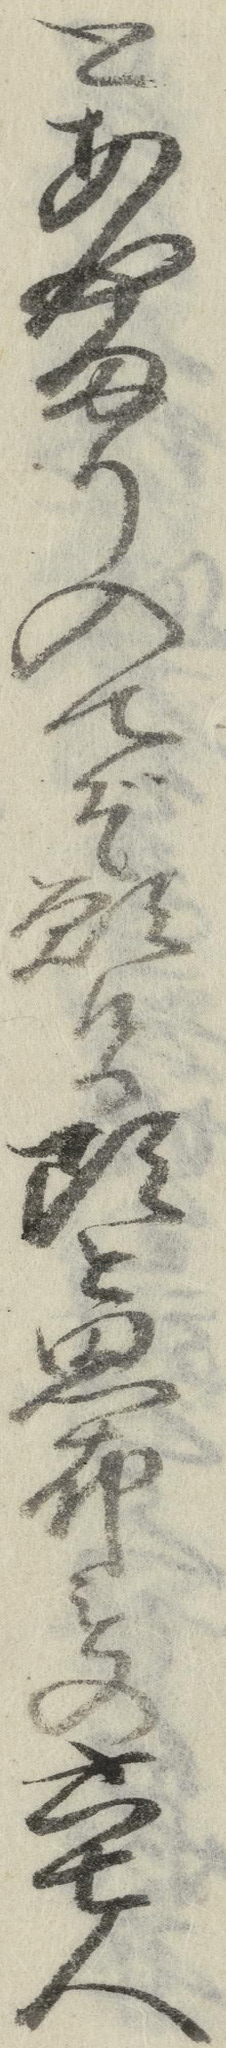とあやまり入てぞ願ける頭と思布もの六七人
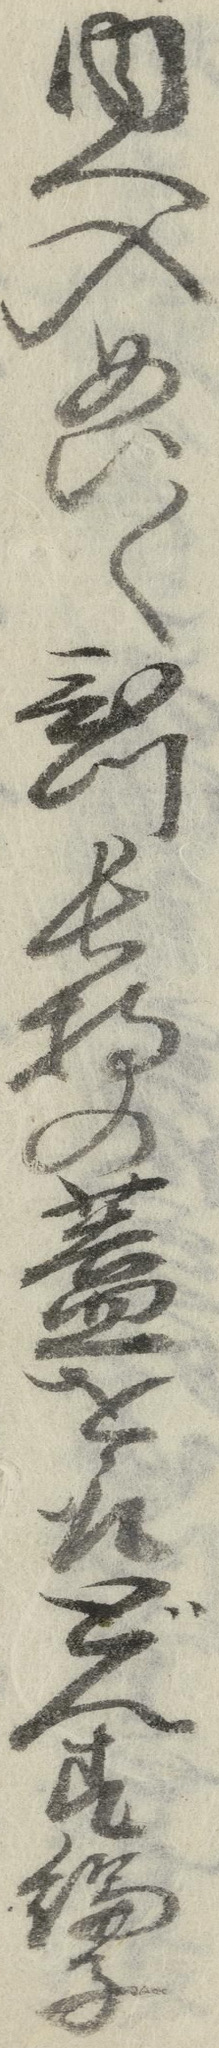内へ入めい〳〵ひつ長持の蓋を取どんす綸子
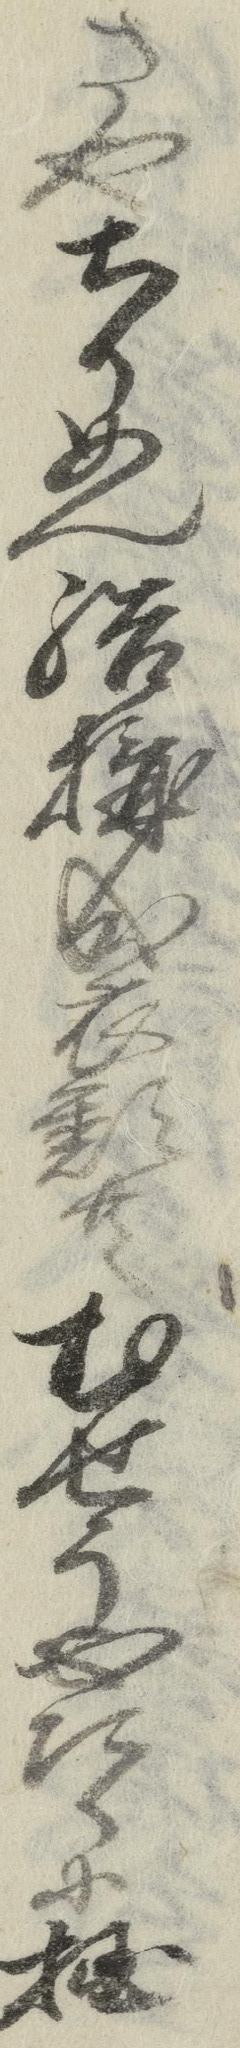さやちりめん結構成衣類共むせうやたらに掴
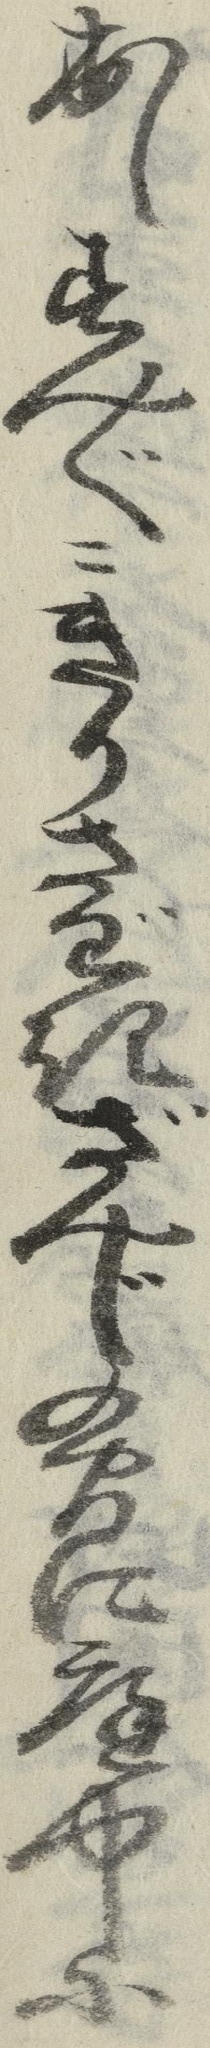出しすん〴〵にきりさばきざんじの間に庭中に
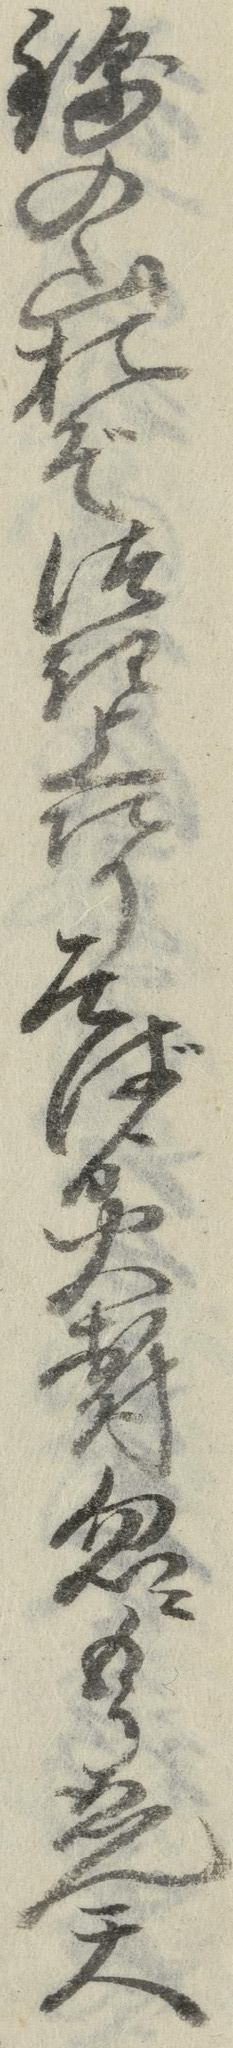錦の山おぞつき上たりそばゟ火お付忽にもうゑん天
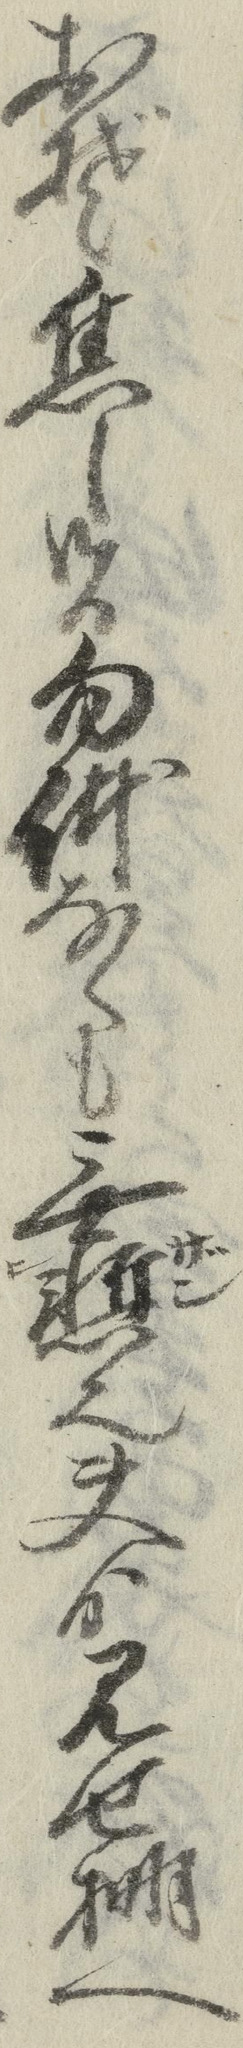をぞ焦しける勿体なくも無慙也夫ゟ見せ棚へ
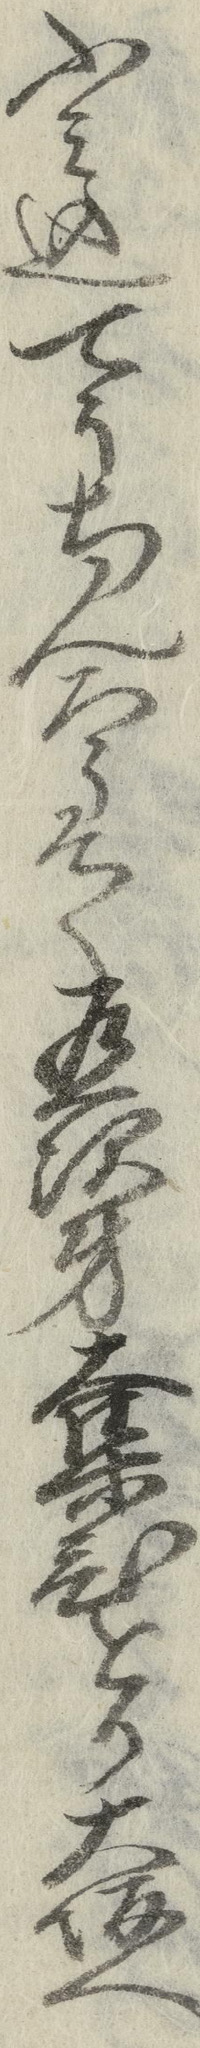ふみ込てうちんろうそく有次第奪ひとり大坂へ
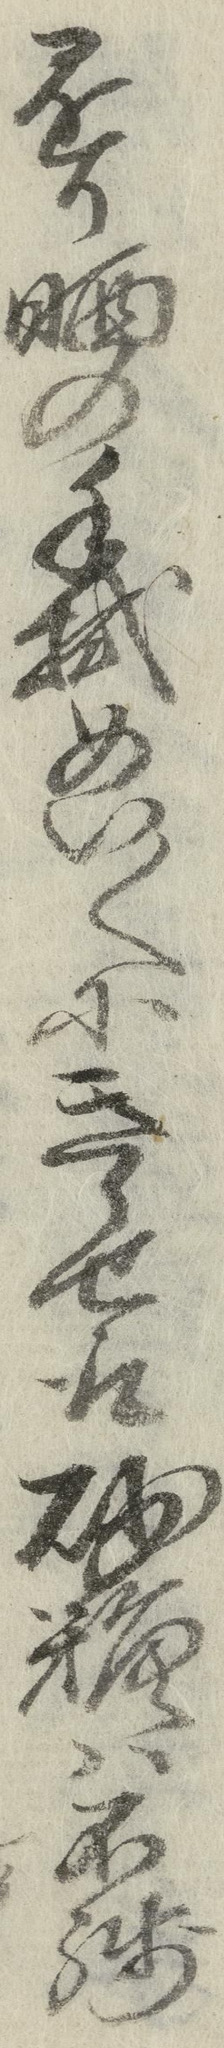懸り晒の手拭めい〳〵にきかせ取砂糖は不残
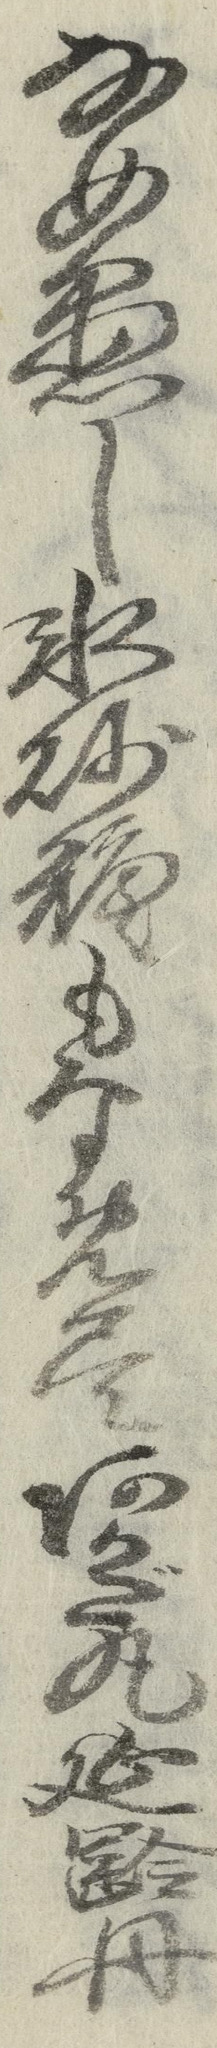なめ盡し氷砂糖もなめ尽あかざ丸延齢丹
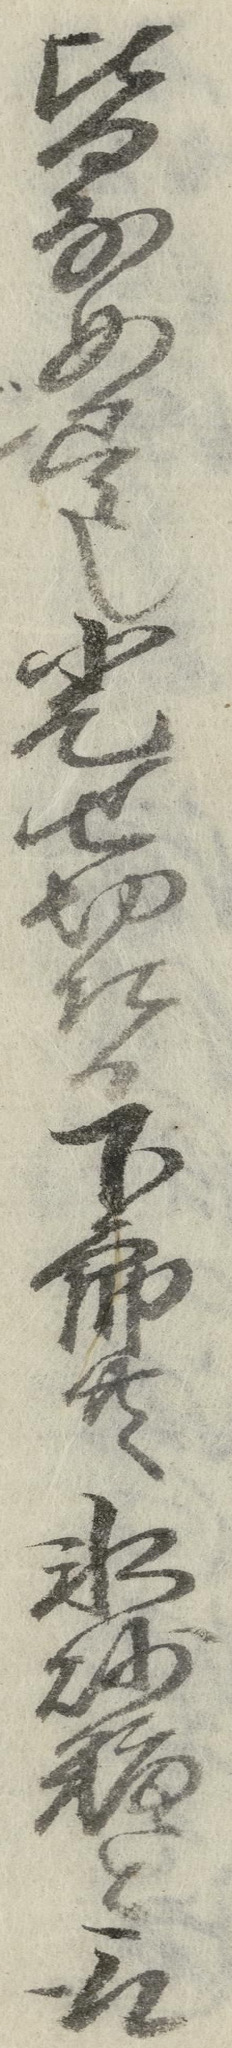皆なめ尽し登せ切たる下郎共氷砂糖と取
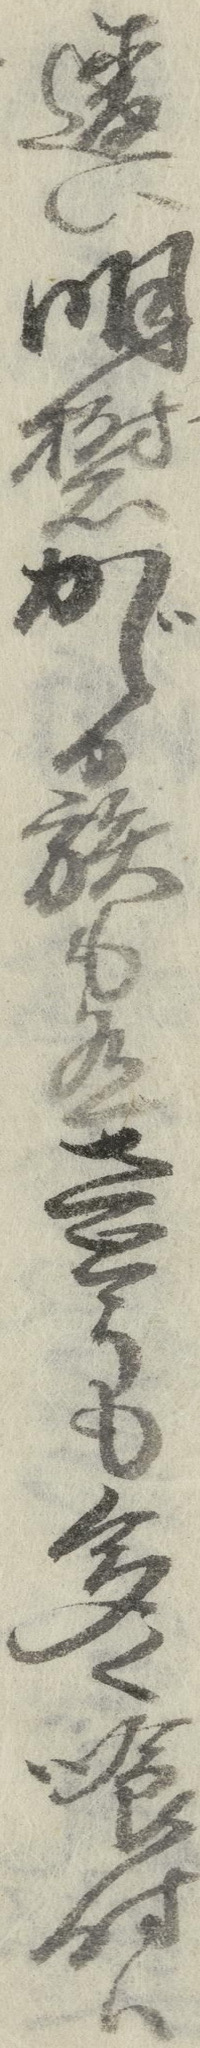違い明礬かじる族も有さとうも多く喰付は
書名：浅間大焼騒動記　中
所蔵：東京大学地震研究所図書室 Earthquake Research Institute Library, The University of Tokyo, JAPAN
